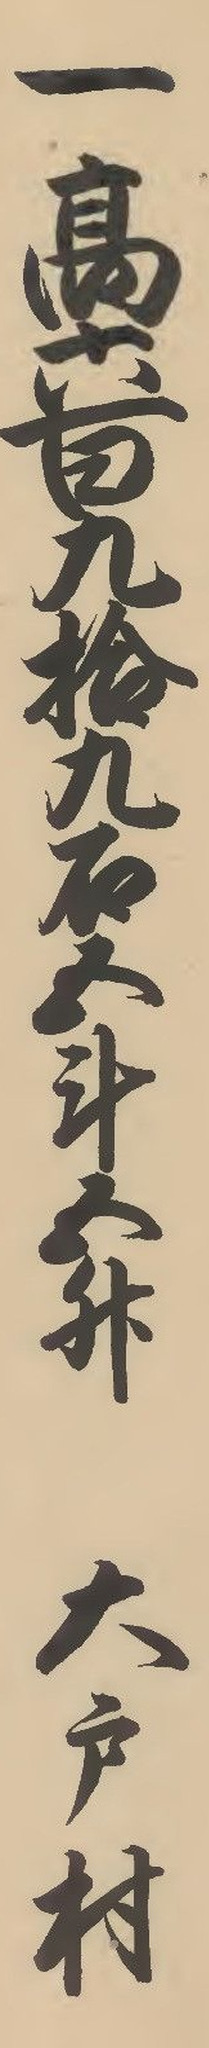一髙六百九拾九石五斗五升大戸村
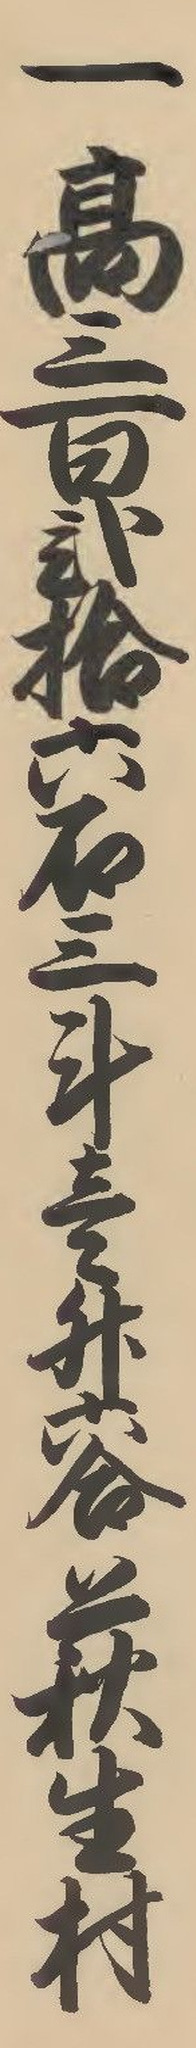一髙三百弐拾六石三斗壱升六合萩生村

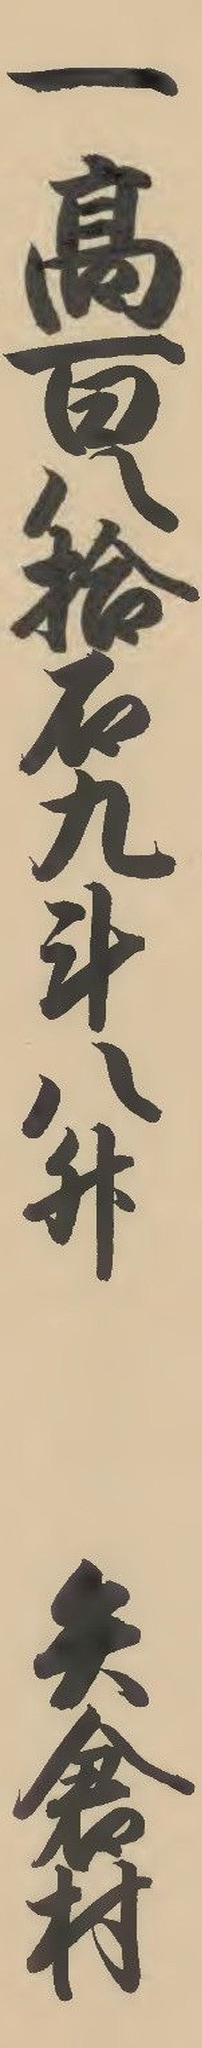一髙百八拾石九斗八升矢倉村
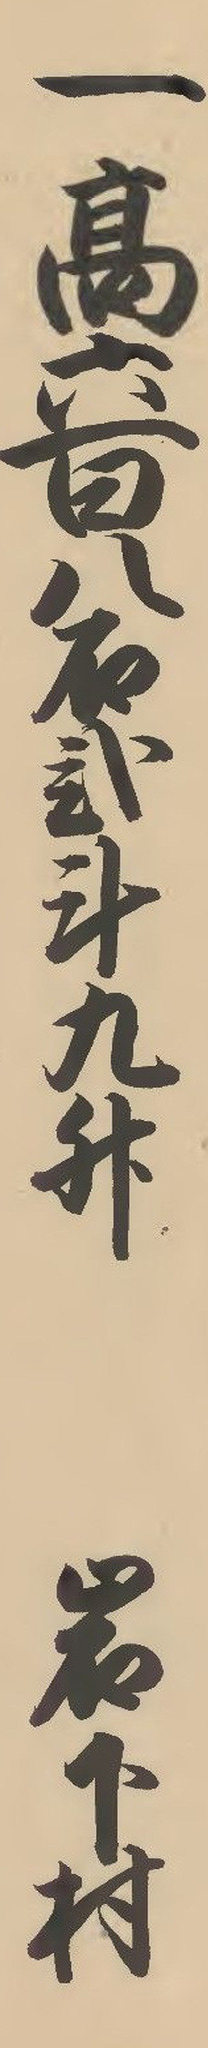一髙六百八石弐斗九升岩下村
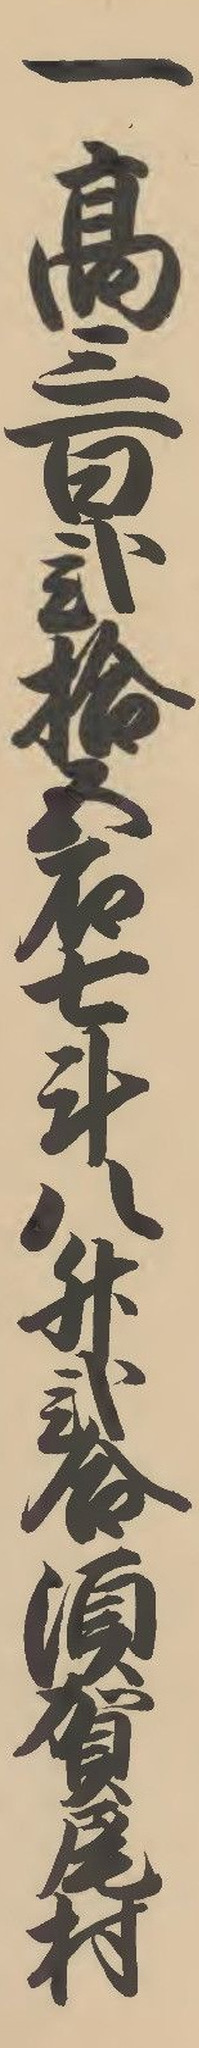一髙三百弐拾五石七斗八升弐合須賀尾村
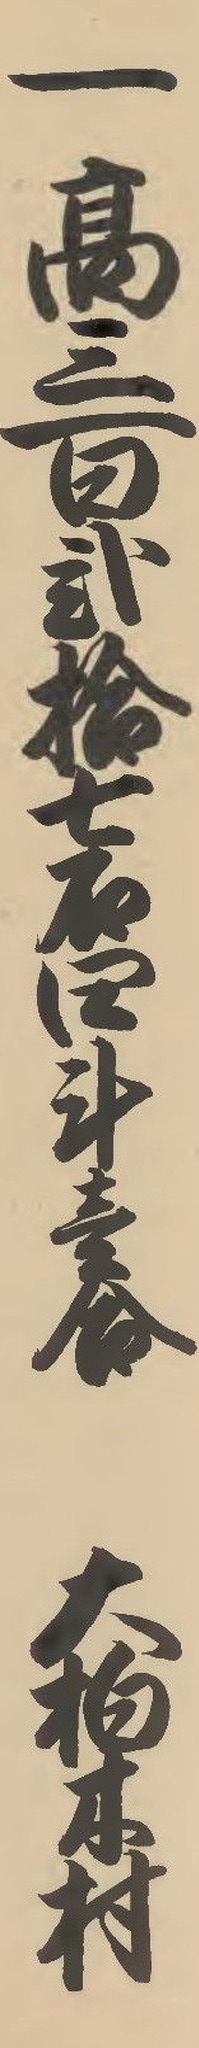一髙三百弐拾七石四斗壱合大柏木村
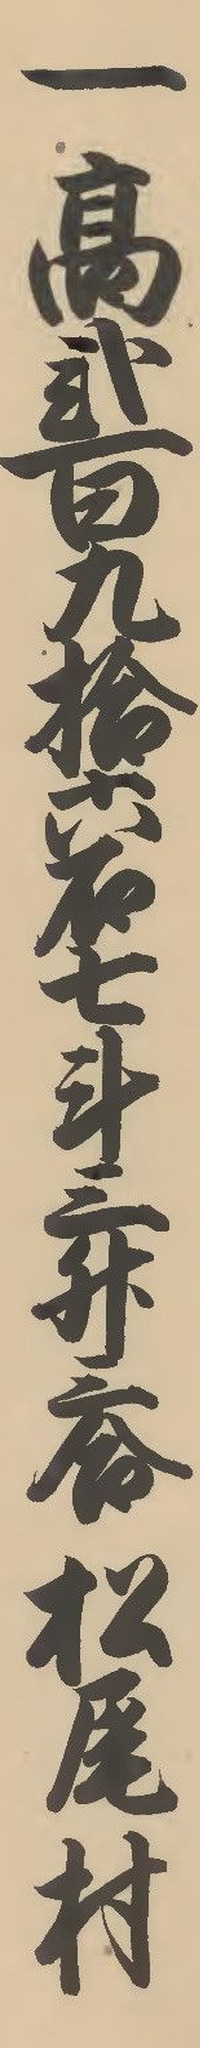一髙弐百九拾六石七斗三升三合松尾村
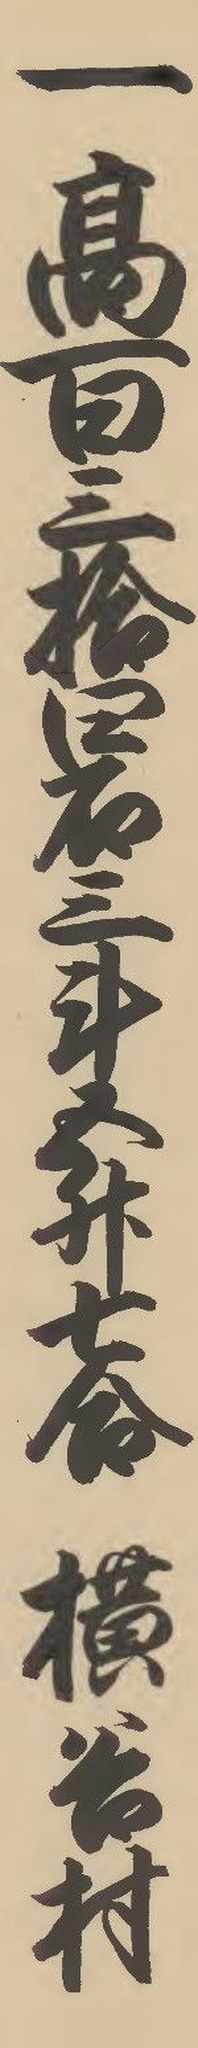一髙百三拾四石三斗五升七合横谷村
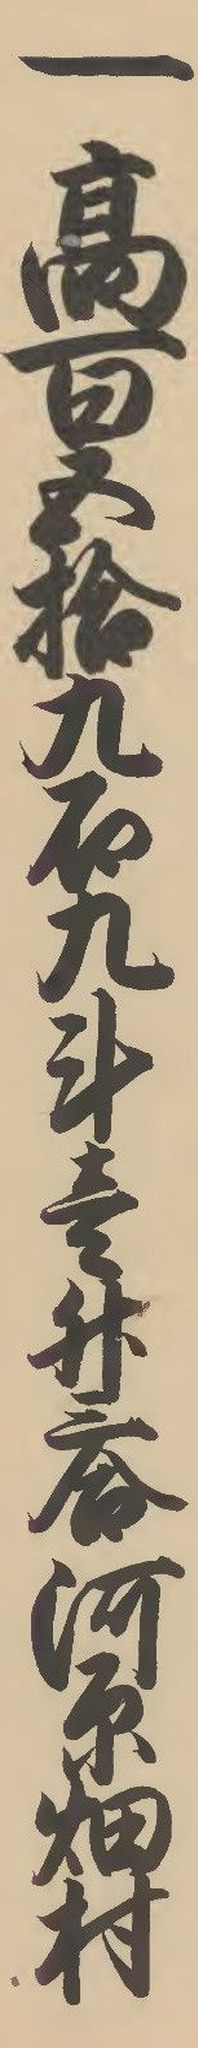一髙百五拾九石九斗壱升三合河原畑村

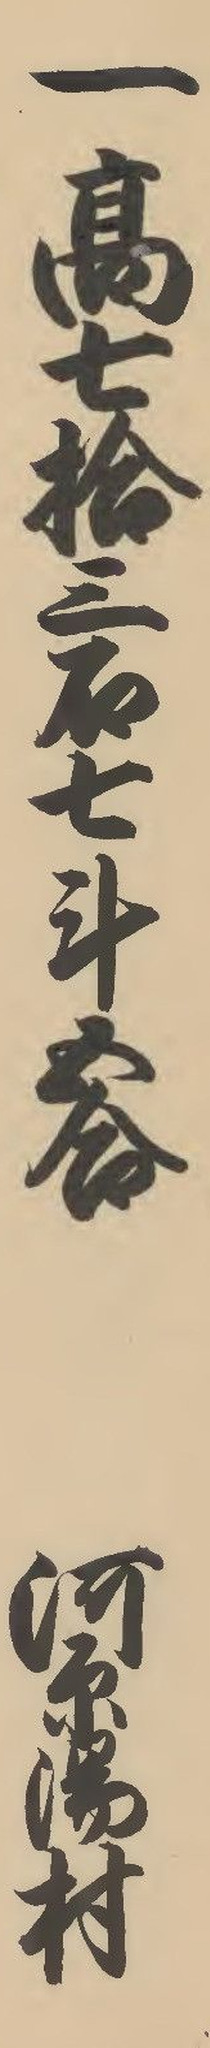一髙七拾三石七斗五合河原湯村
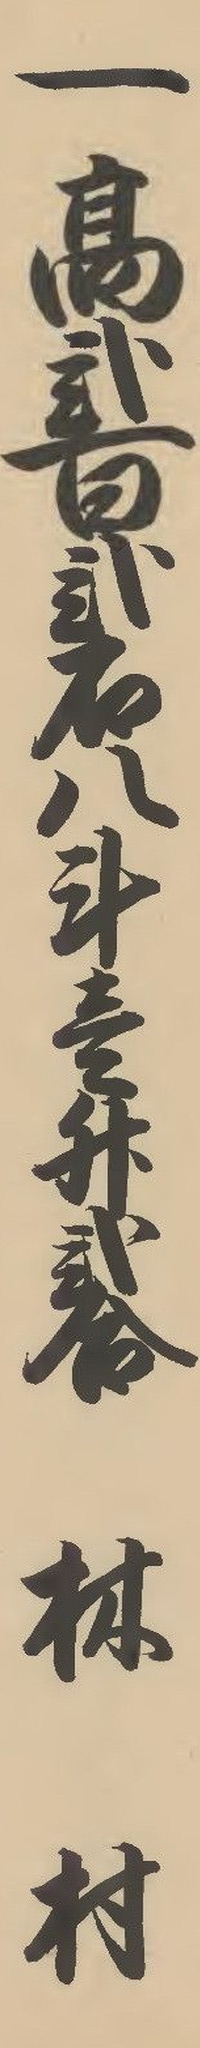一髙弐百弐石八斗壱升弐合林村
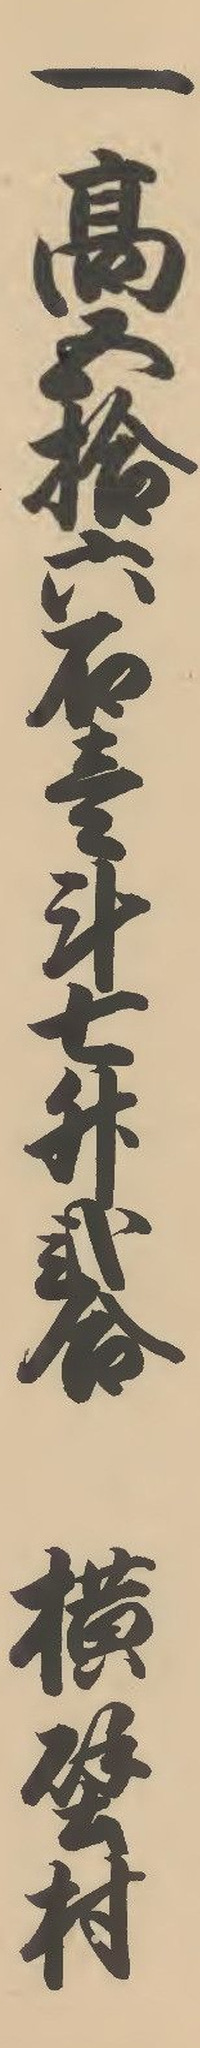一髙五拾六石壱斗七升弐合横壁村
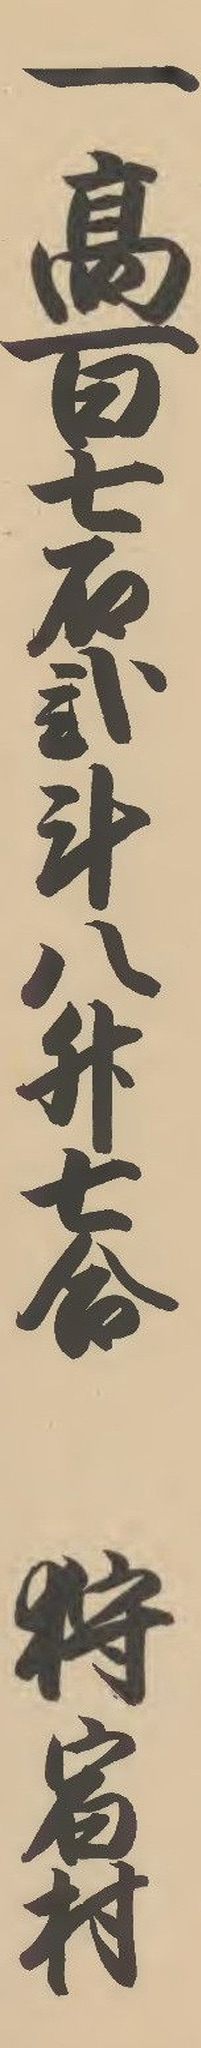一髙百七石弐斗八升七合狩宿村
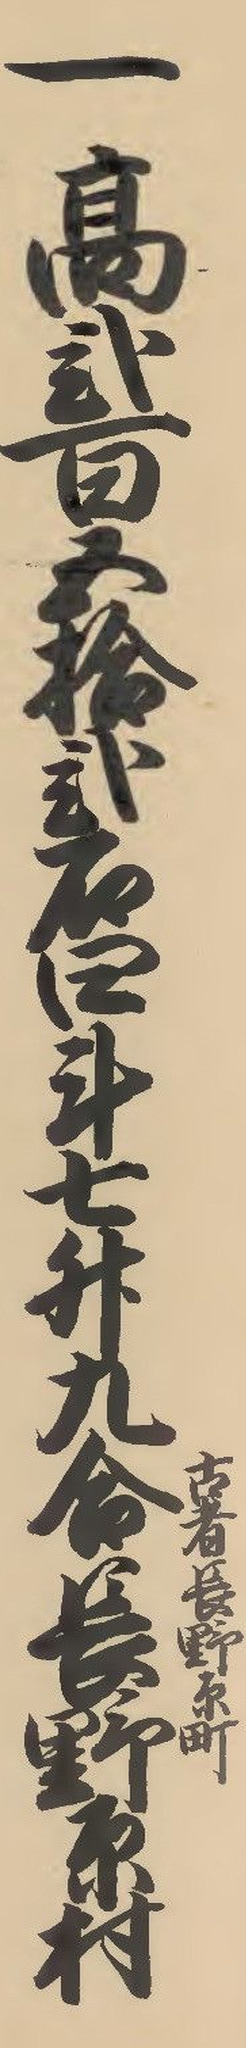一髙弐百五拾弐石四斗七升九合長野原村
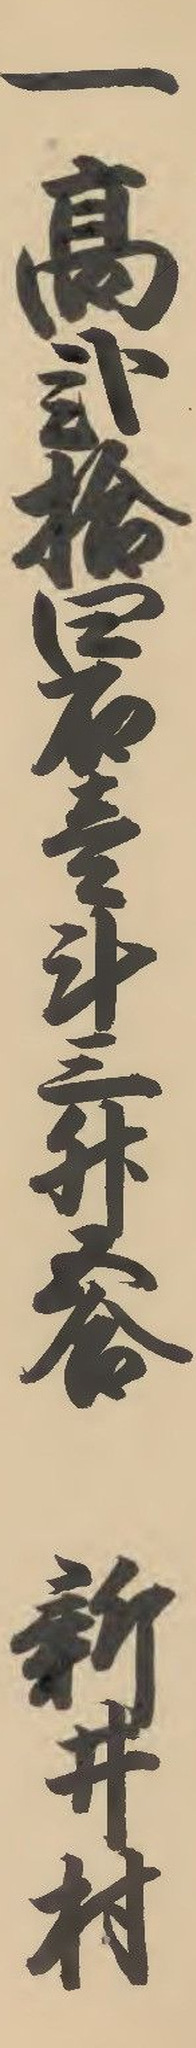一髙弐拾四石壱斗三升五合新井村
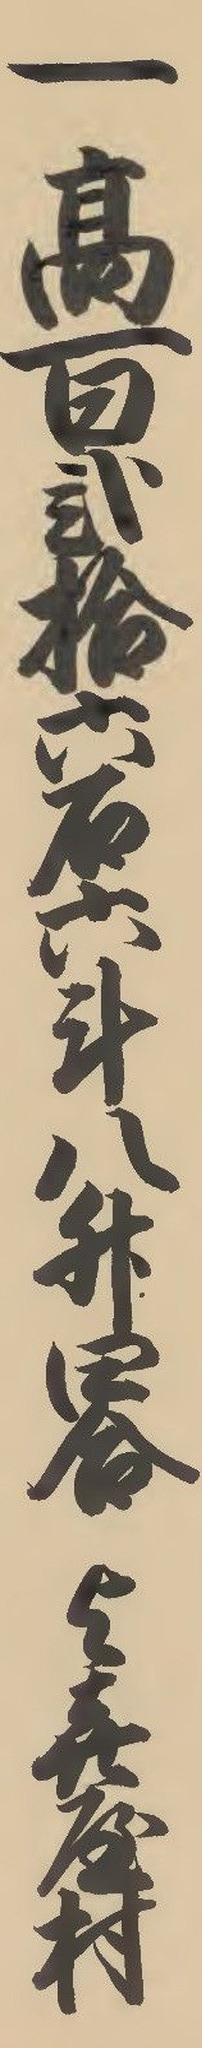一髙百弐拾六石六斗八升四合与喜屋村
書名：上野国郷帳
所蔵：国立公文書館 National Archives of Japan
